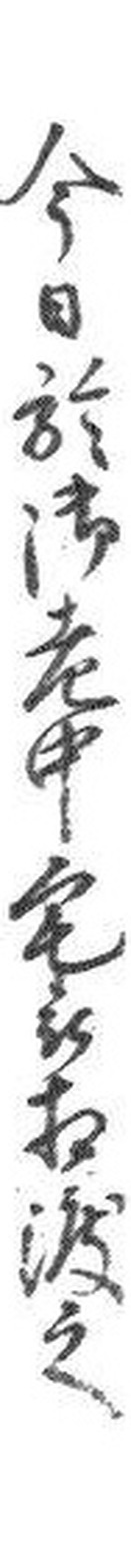今日於御老中宅被相渡之
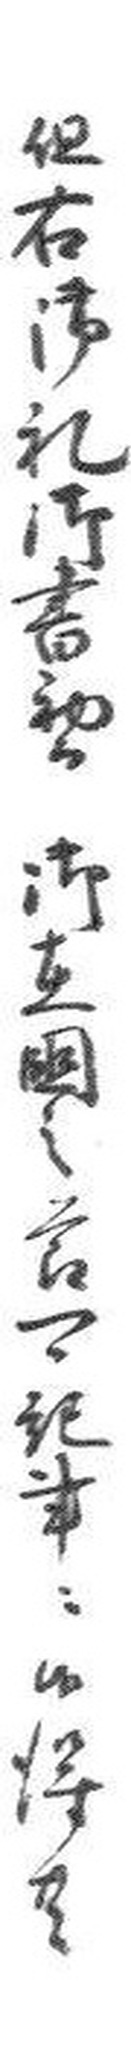但右御礼御書初而御在国之節可記事ニ候得共
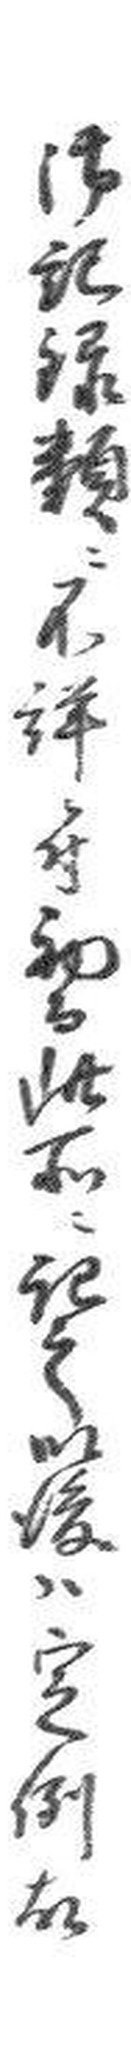御記録類ニ不詳ニ付初而此所ニ記之以後は定例故
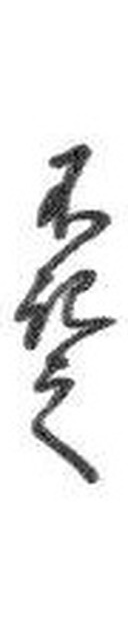不記之
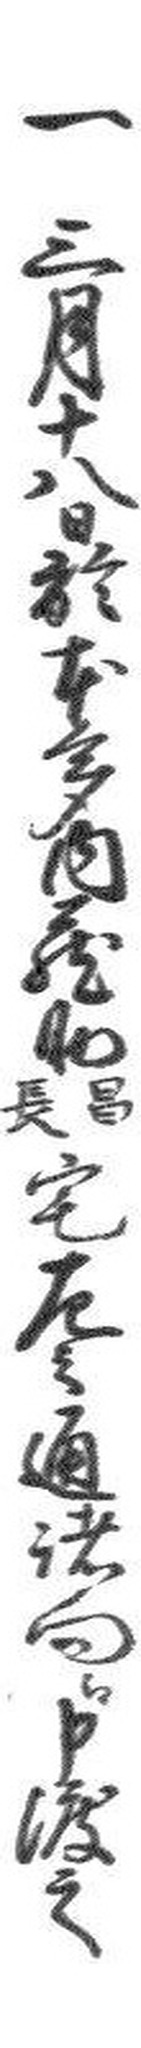一三月十八日於本多内蔵助昌長宅左之通諸向江申渡之
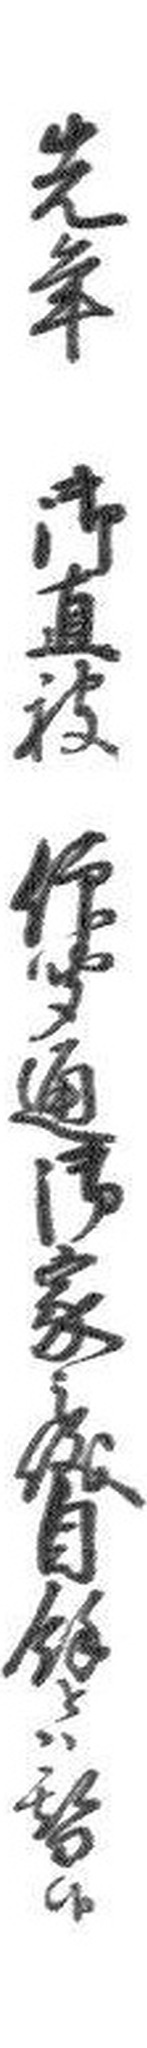先年御直被仰聞通御家之儀自余とは替候
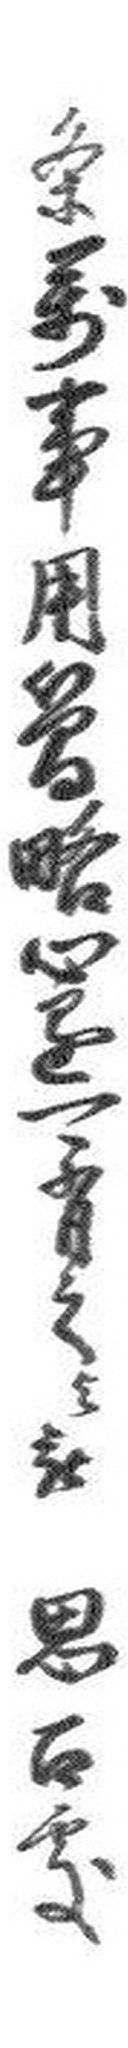条万事用簡略心懸可有之与被思召処
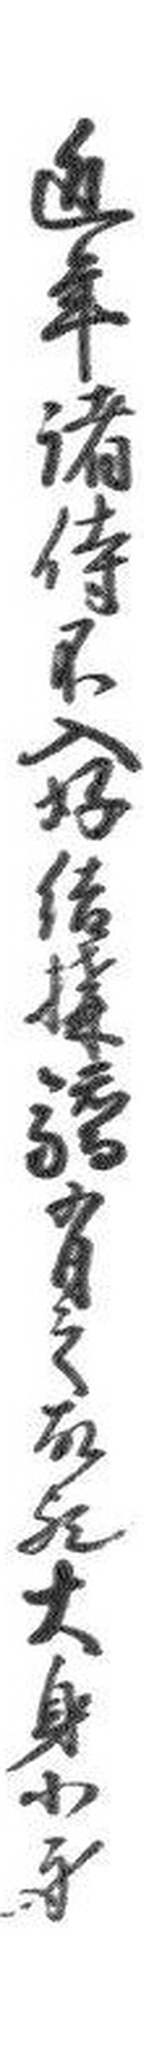近年諸侍不入好結構驕有之故歟大身小身
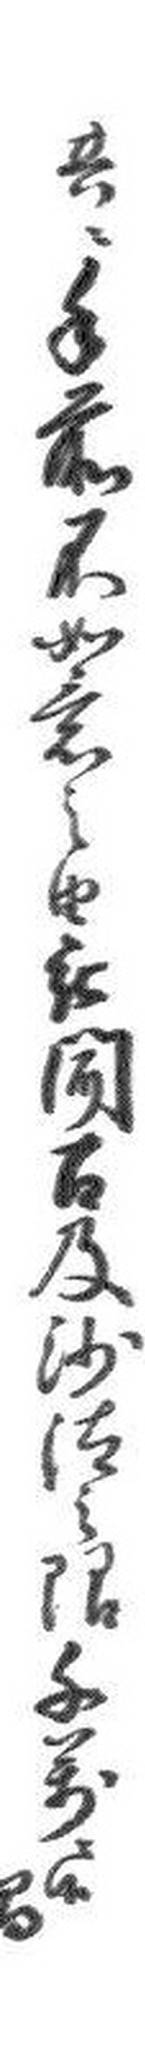共ニ手前不如意之由被聞召及沙汰之限千万ニ候間
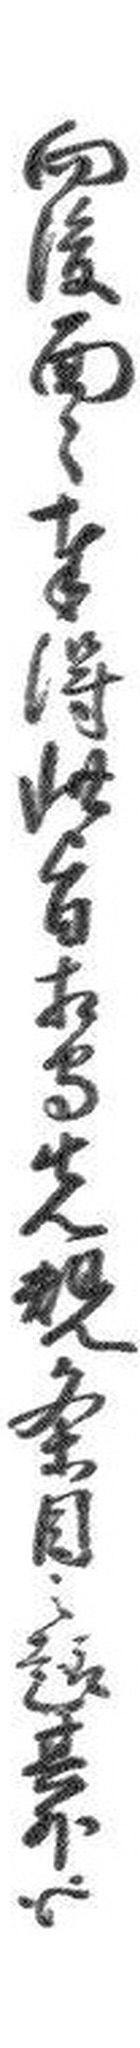向後面々奉得此旨相守先規条目之趣其外ニも
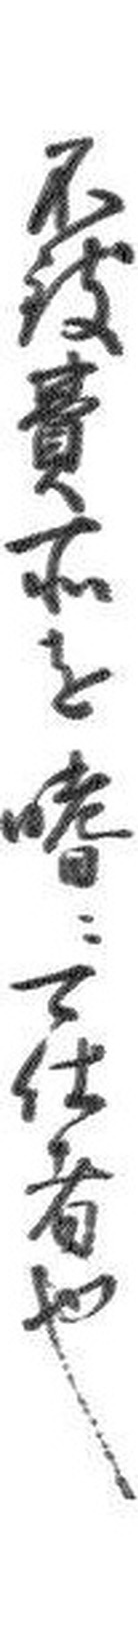不致費所を嗜ニ可仕者也

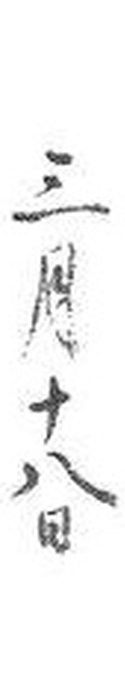三月十八日
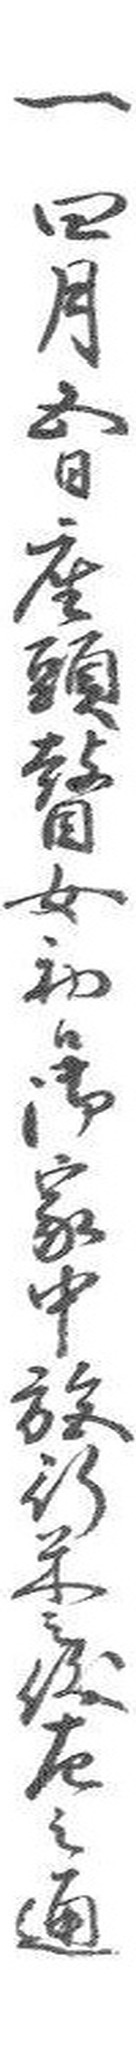一四月五日座頭瞽女初而御家中施行米之儀左之通
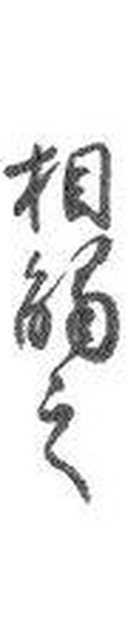相触之
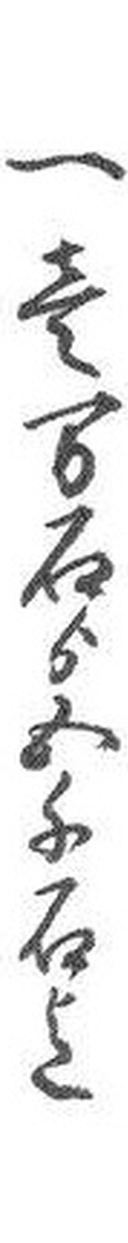一壱万石ゟ五千石迄
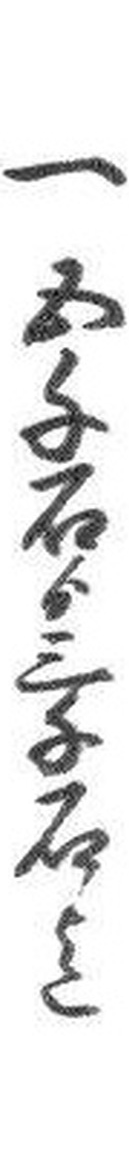一五千石ゟ三千石迄
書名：家譜 六 光通公 従万治三年到寛文三年
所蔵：福井県文書館 Fukui Prefectural Archives
